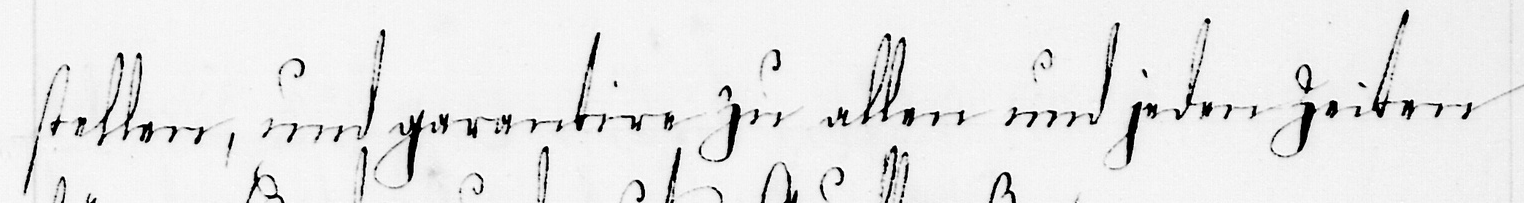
stellen, und garantiere zu allen und jeden Zeiten
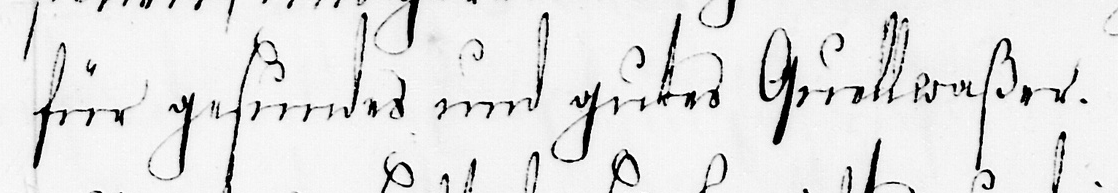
für gesundes und gutes Quellwaßer.
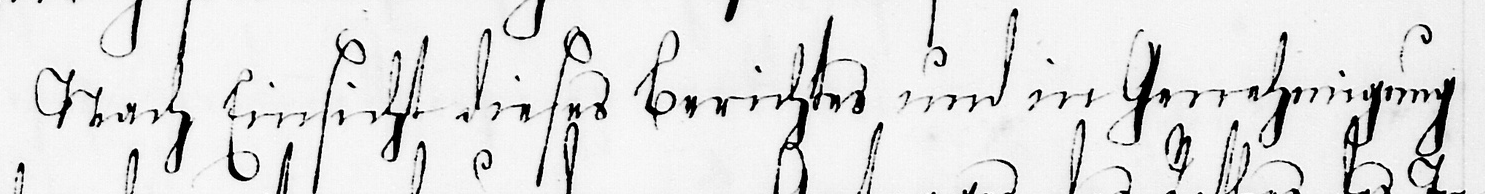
Nach Einsicht dieses Berichtes und in Genehmigung
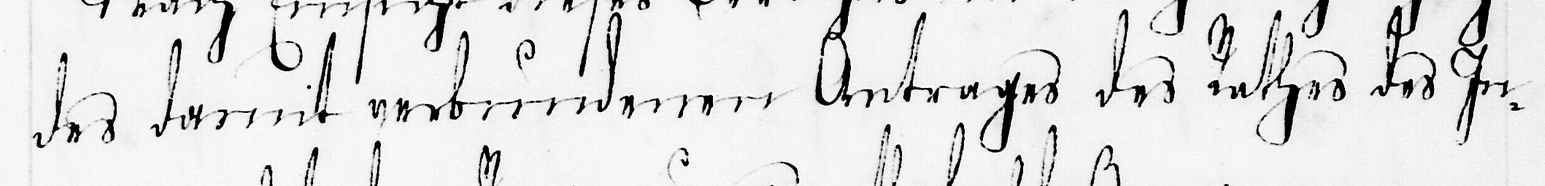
des damit verbundenen Antrages des Rathes des In¬
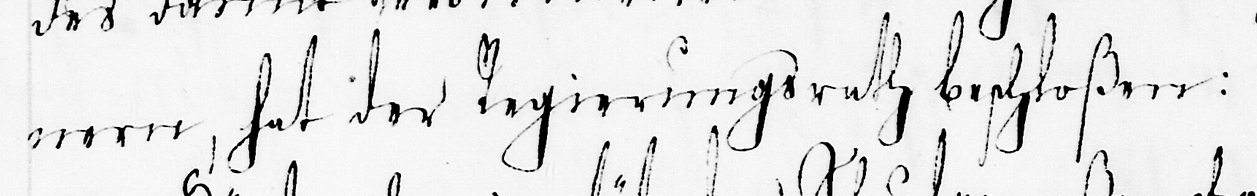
nern, hat der Regierungsrath beschloßen:
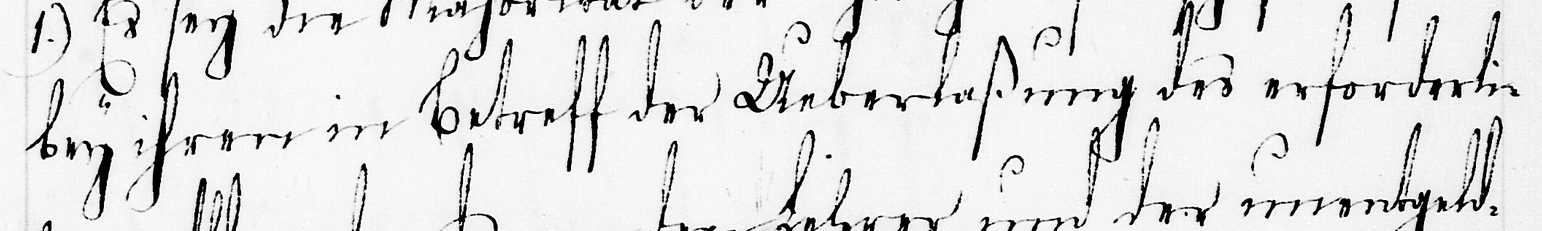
bey ihren in Betreff der Ueberlaßung des erforderli¬
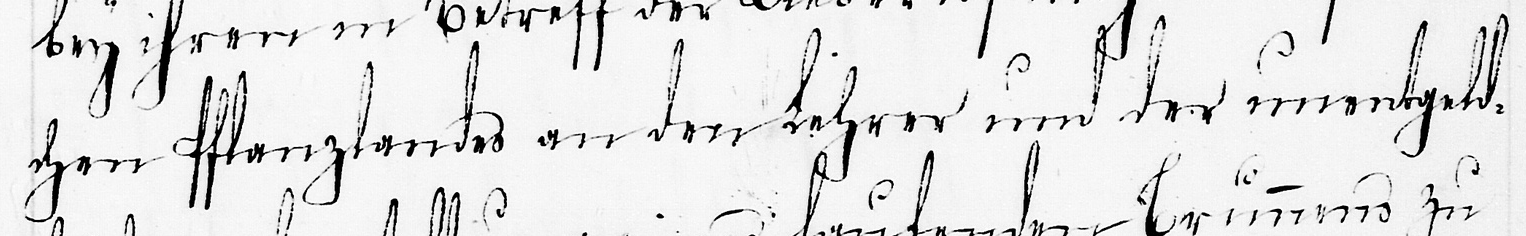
chen Pflanzlandes an den Lehrer und der unentgeld¬
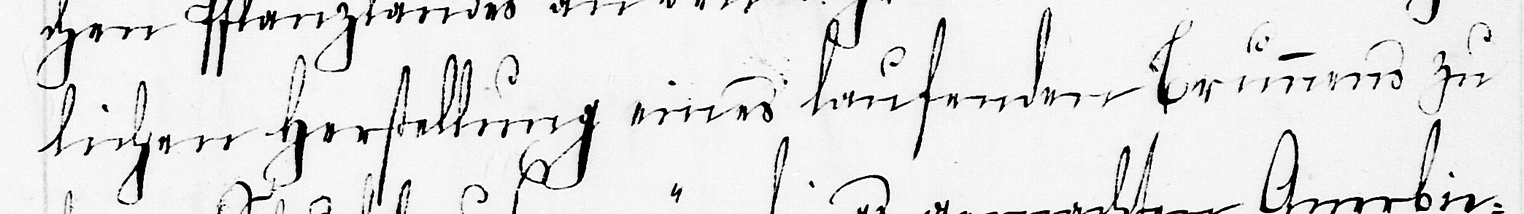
lichen Herstellung eines laufenden Brunnens zu
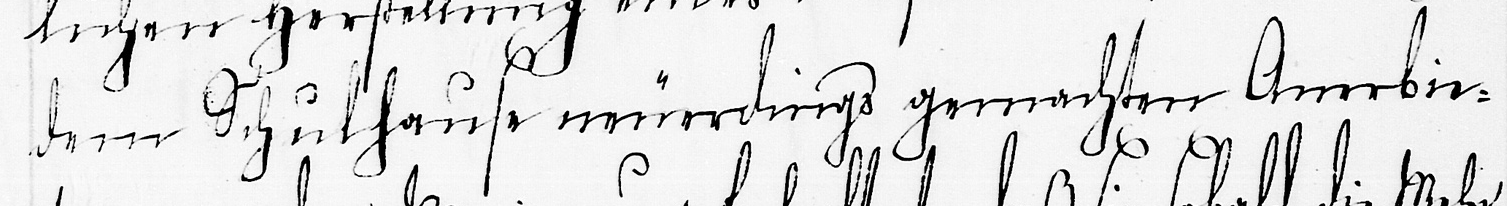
dem Schulhause neuerdings gemachten Anerbie¬
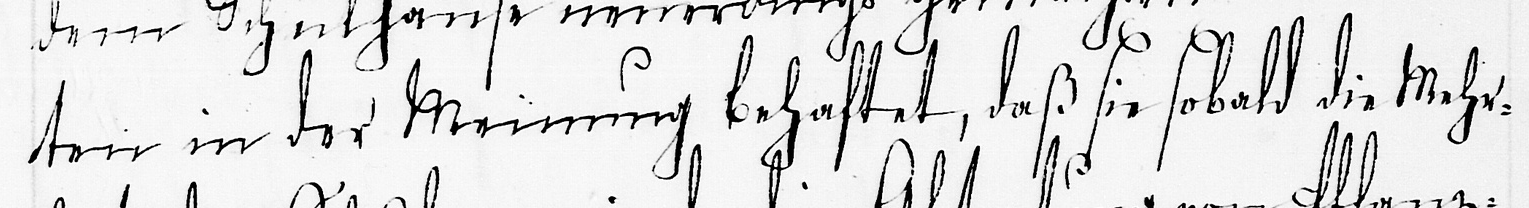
ten in der Meinung behaftet, daß sie sobald die Mehr¬
